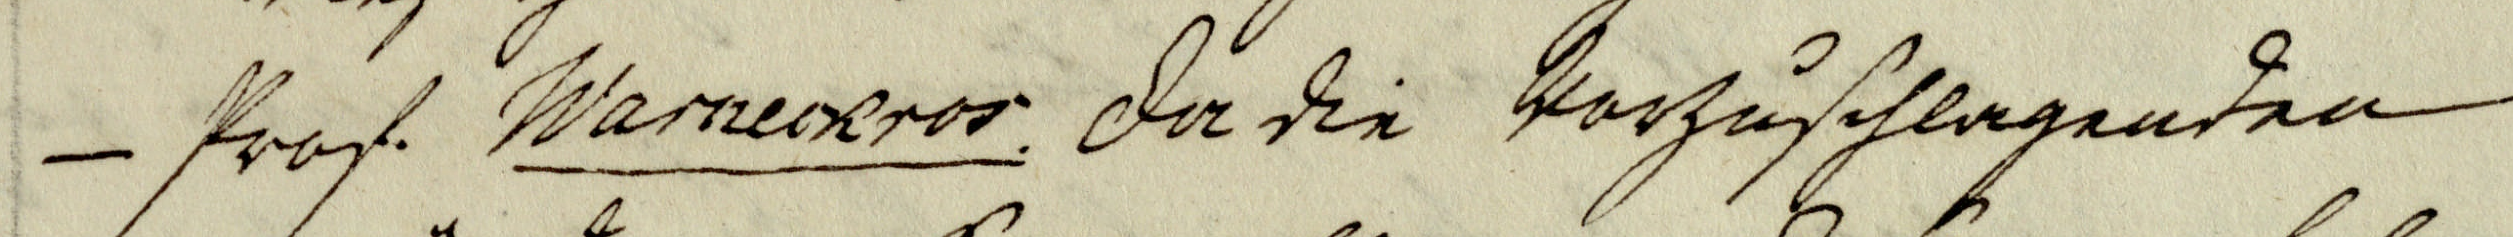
— Prof. Warneckros. Da die Vorzuschlagenden
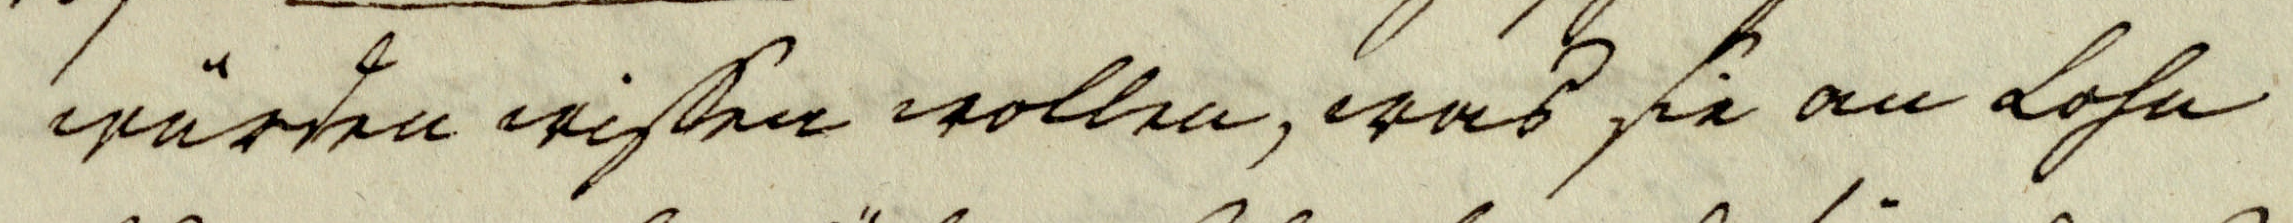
würden wissen wollen, was sie an Lohn
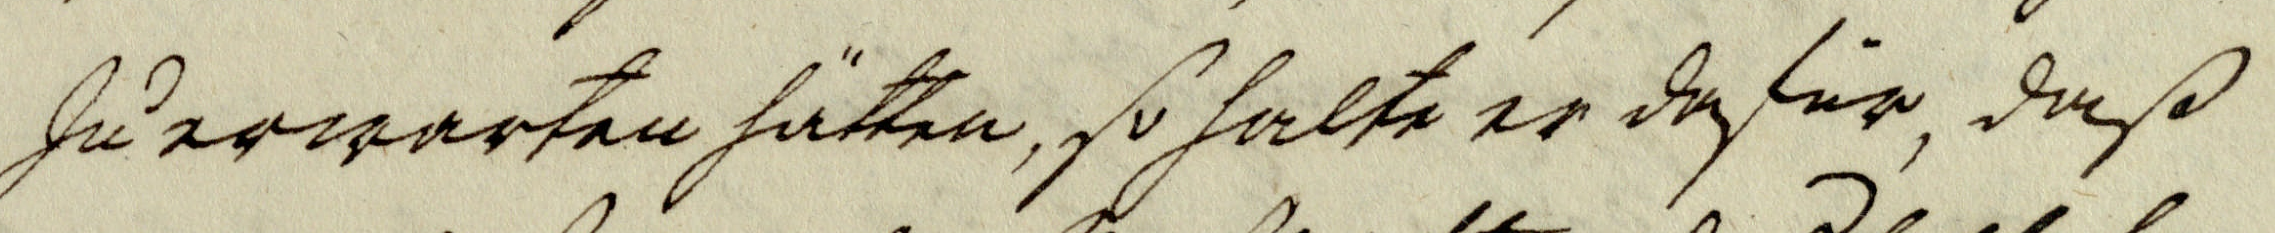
zu erwarten hätten, so halte er dafür, daß
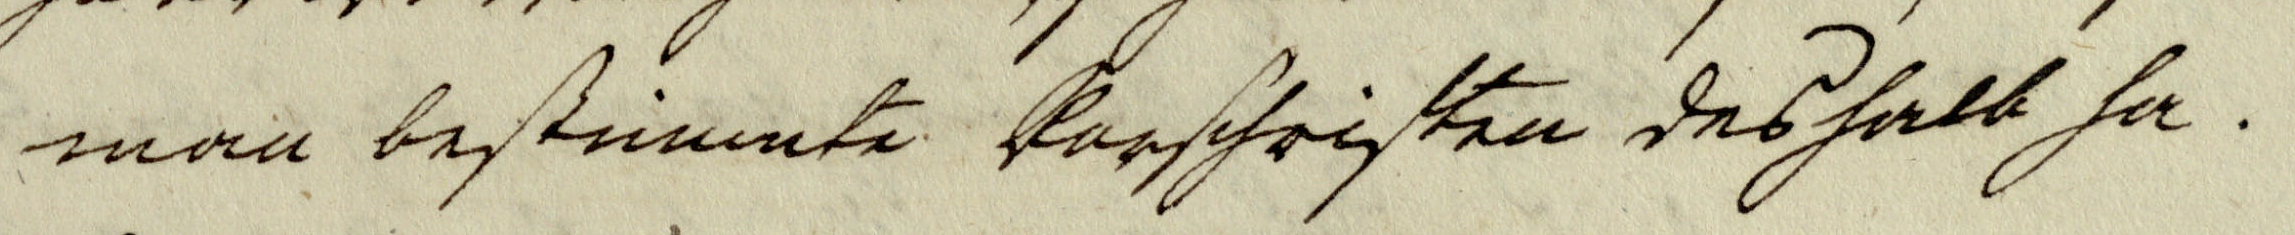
man bestimmte Vorschriften deshalb ha¬
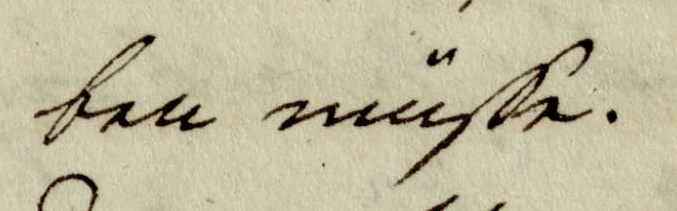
ben müsse.
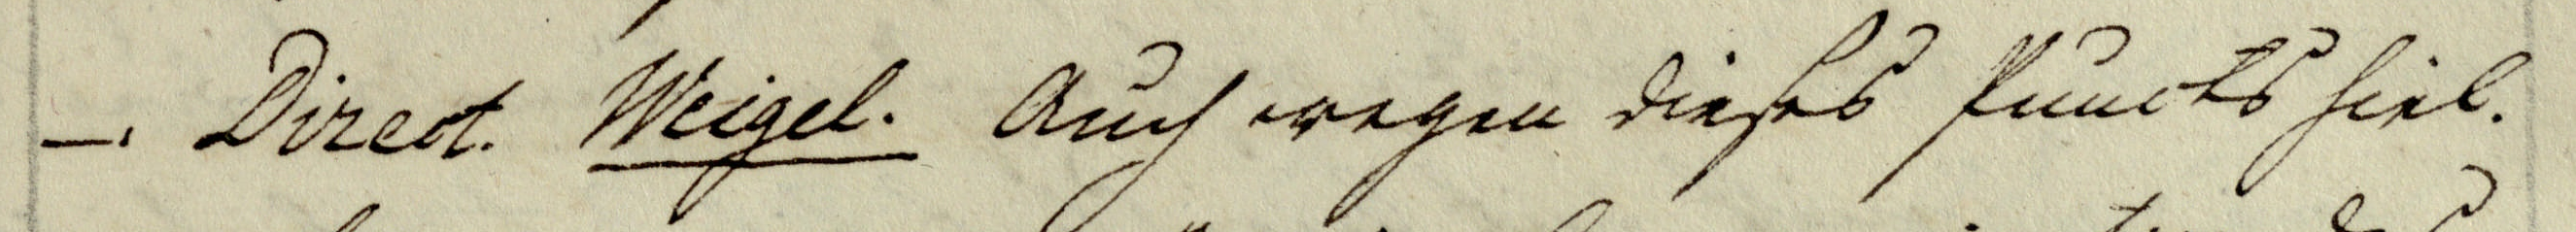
— . Direct. Weigel. Auch wegen dieses Puncts hiel¬
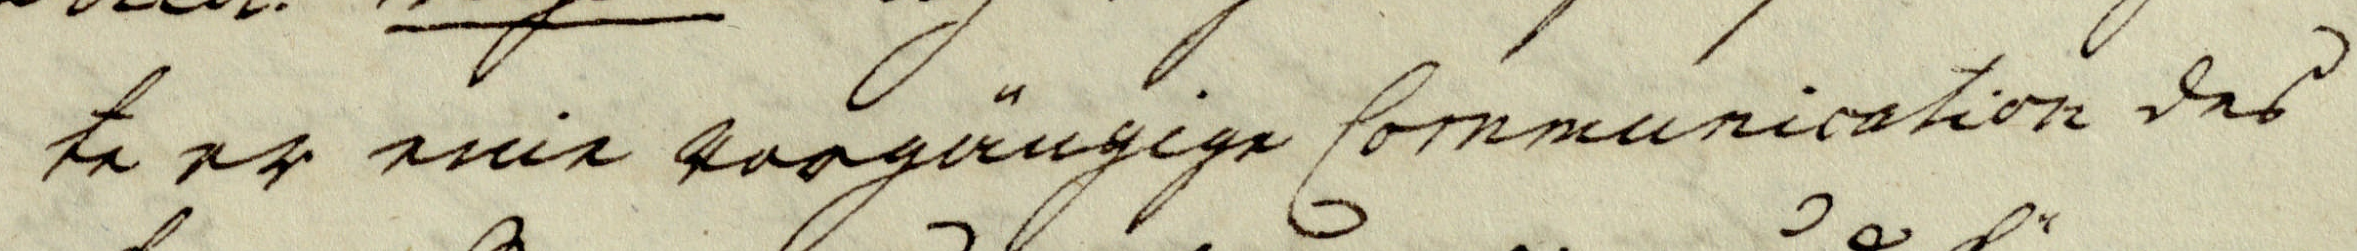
te er eine vorgängige Communication des
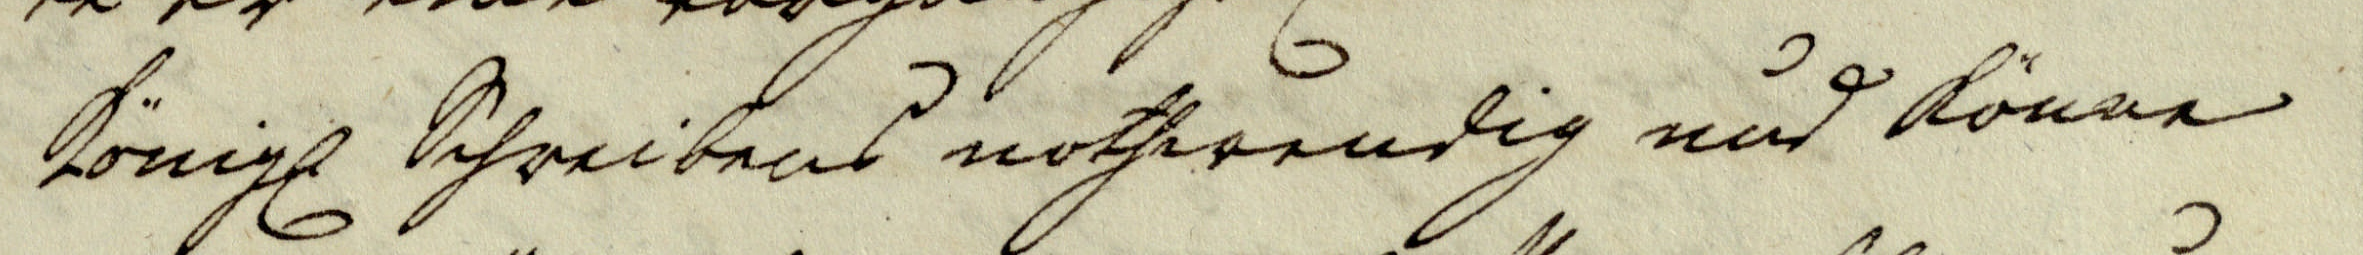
Königl. Schriebens nothwendig und könne
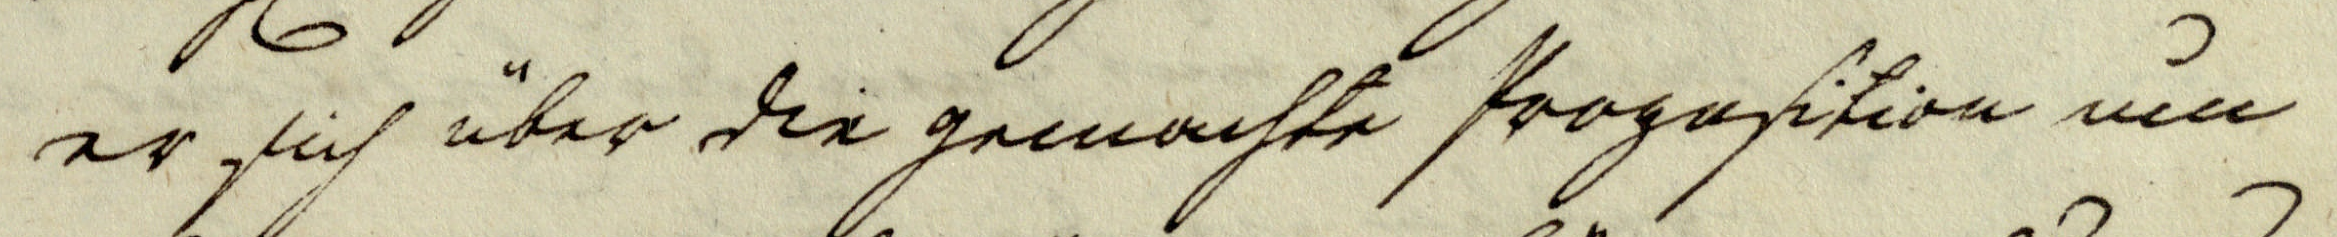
er sich über die gemachte Proposition um
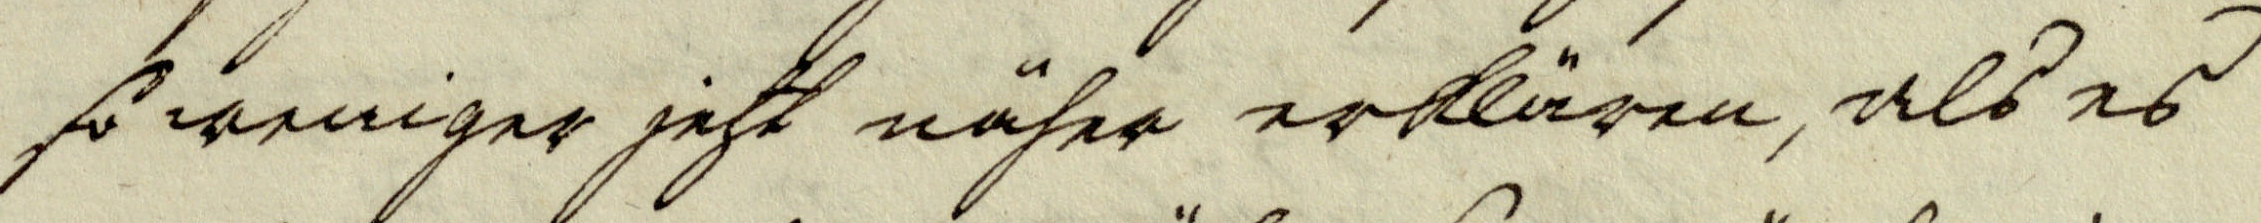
so weniger jetzt näher erklären, als es
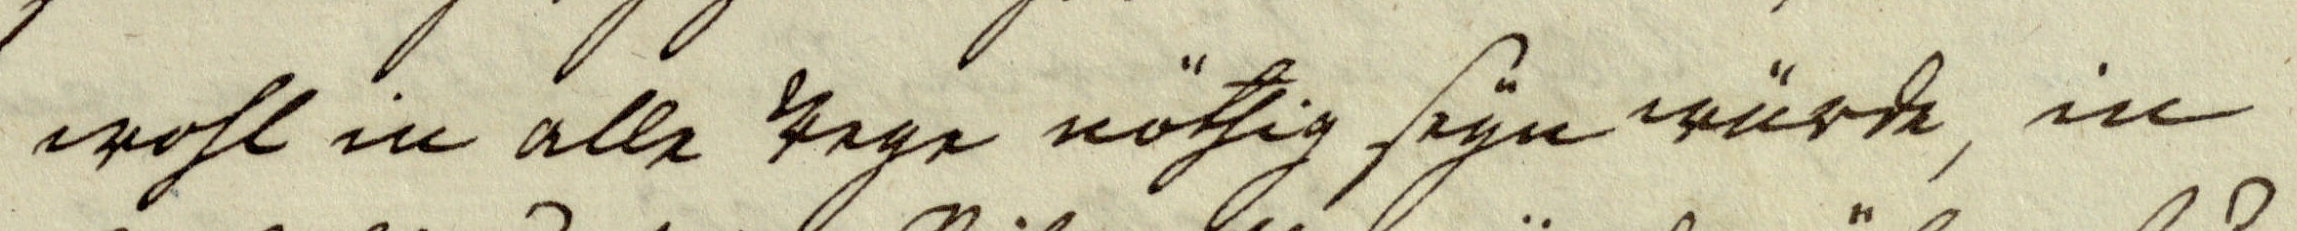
wohl in alle Tage nöthig seÿn würde, in
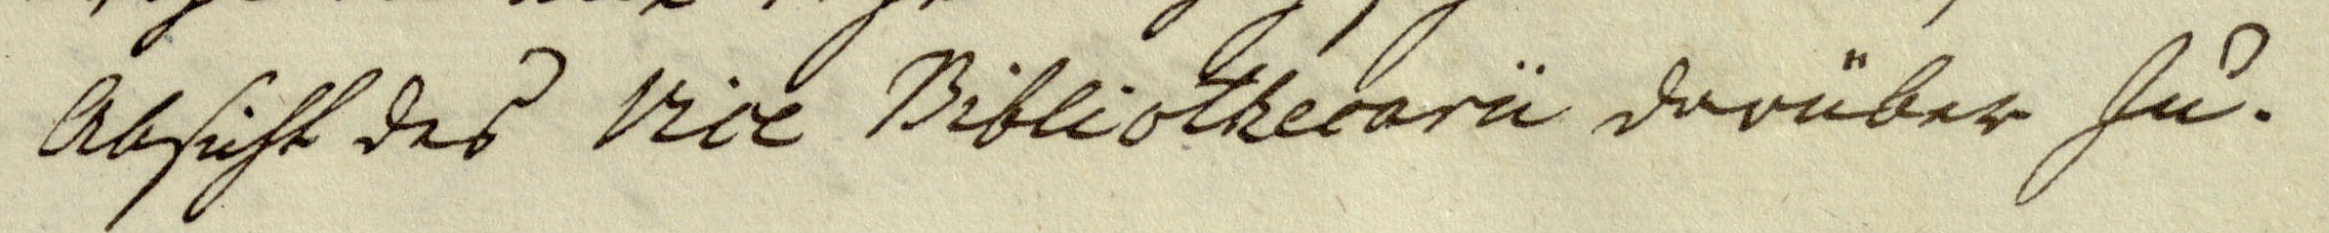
Absicht des Vice Bibliothecarii darüber zu¬
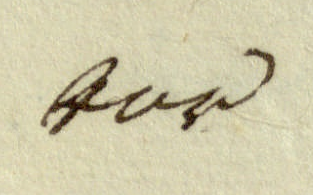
vor
